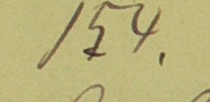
154
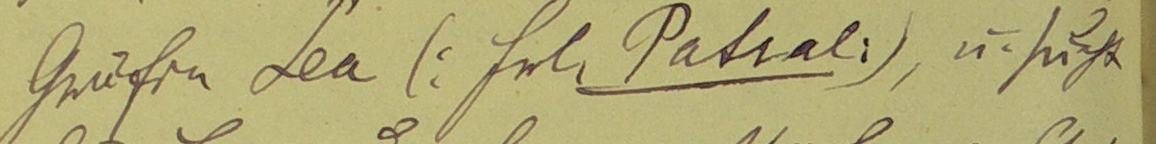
Gräfin Lea (: Frl. Patral :) und sucht
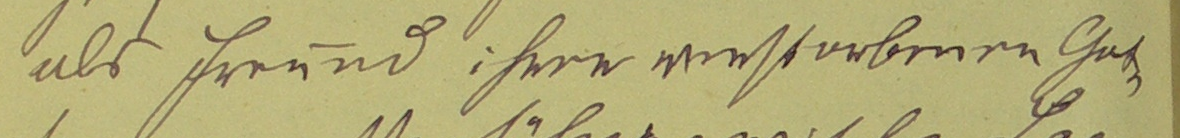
als Freund ihrer verstorbenen Gat¬
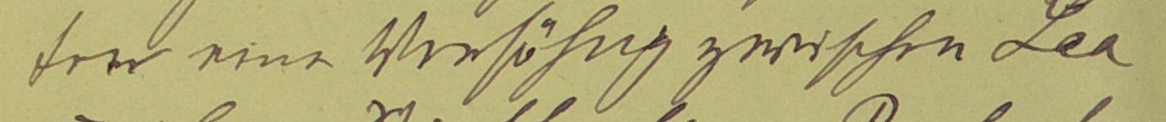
ten eine Versöhnung zwischen Lea
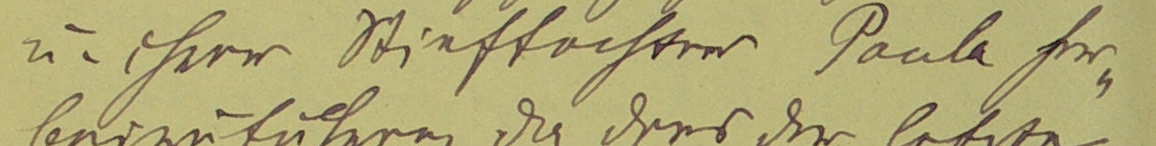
und ihrer Stieftochter Paula her¬
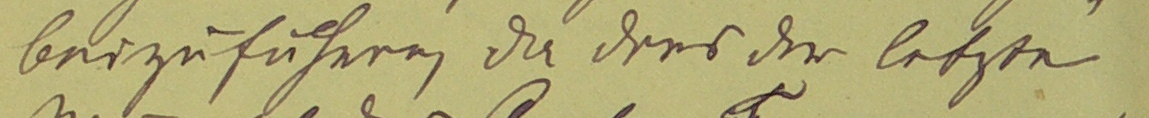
beizuführen, da dies der letzte
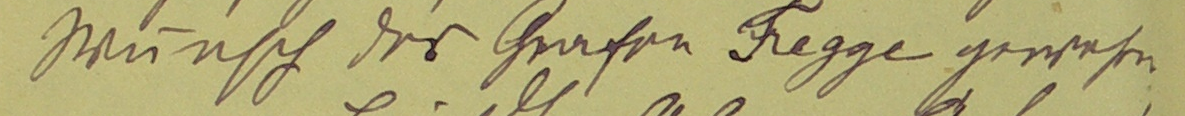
Wunsch des Grafen Fregge gewesen
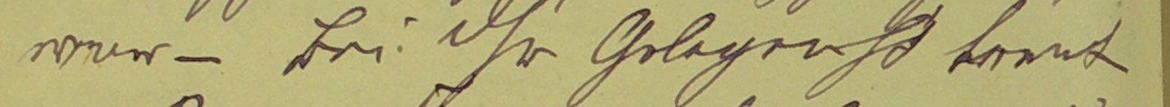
war.- Bei dieser Gelegenheit lernt
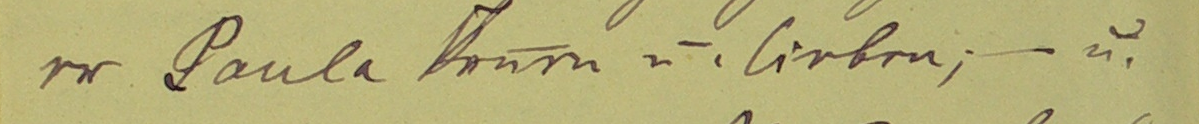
er Paula kennen und lieben;- und
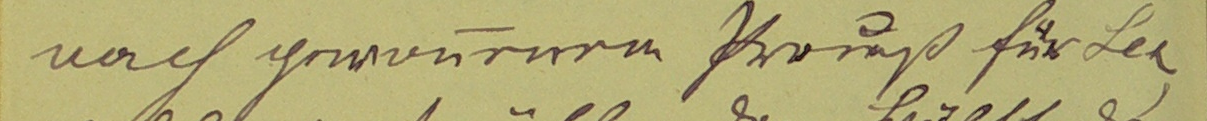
nach gewonnenem Prozeß für Lea
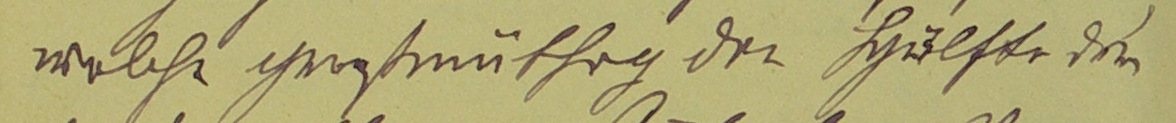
welche großmüthig die Hälfte der
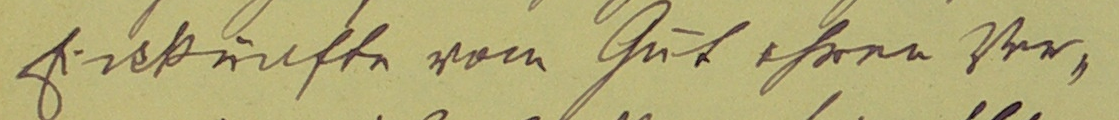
Einkünfte vom Gut ihren Ver¬
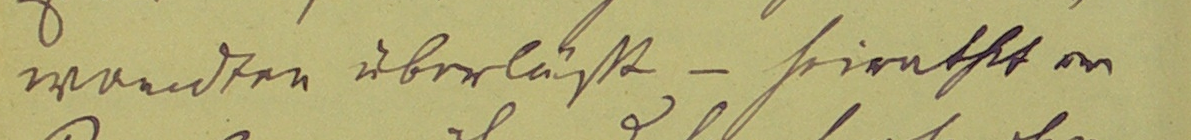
wandten überläßt—heirathet er
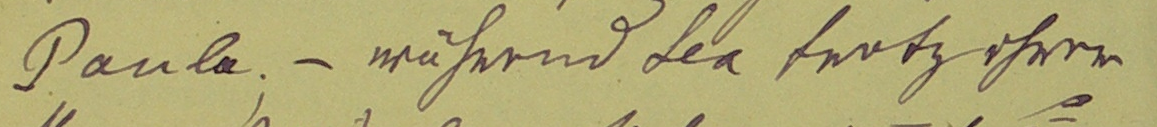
Paula;--während Lea trotz ihrer
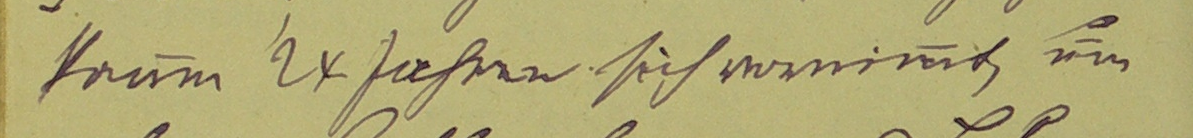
kaum 2 x Jahren sich vornimmt um
